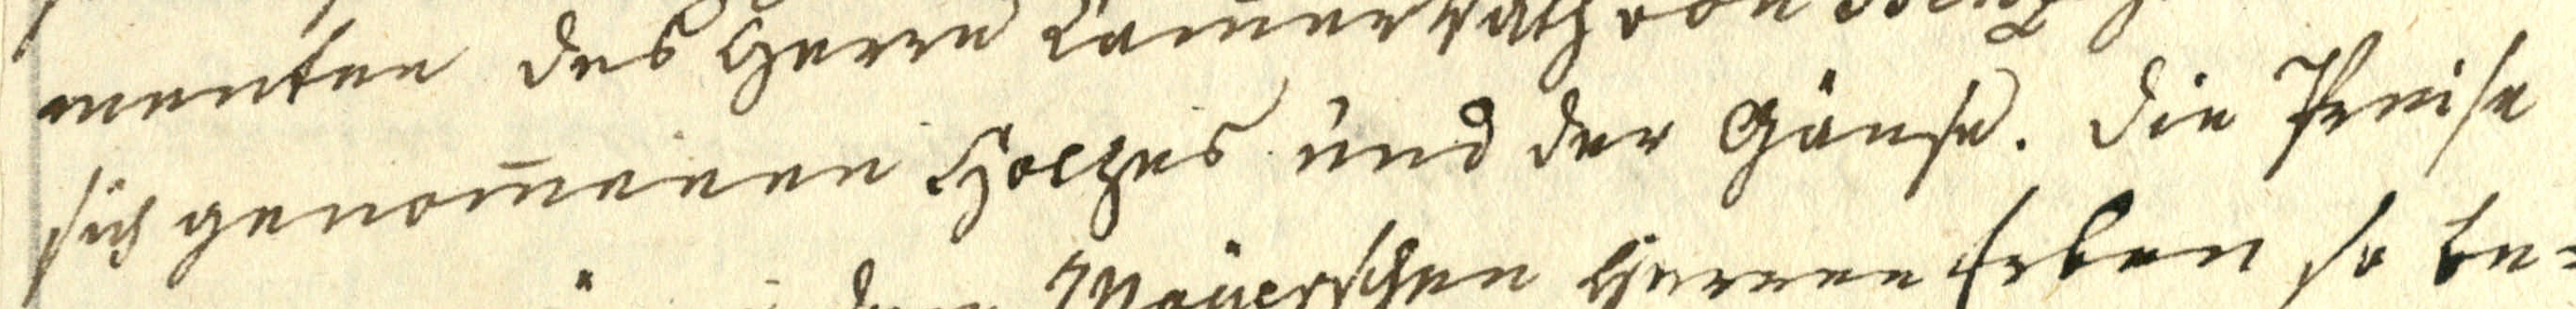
sich genomenen Holzes und der Gänse. Die Preise
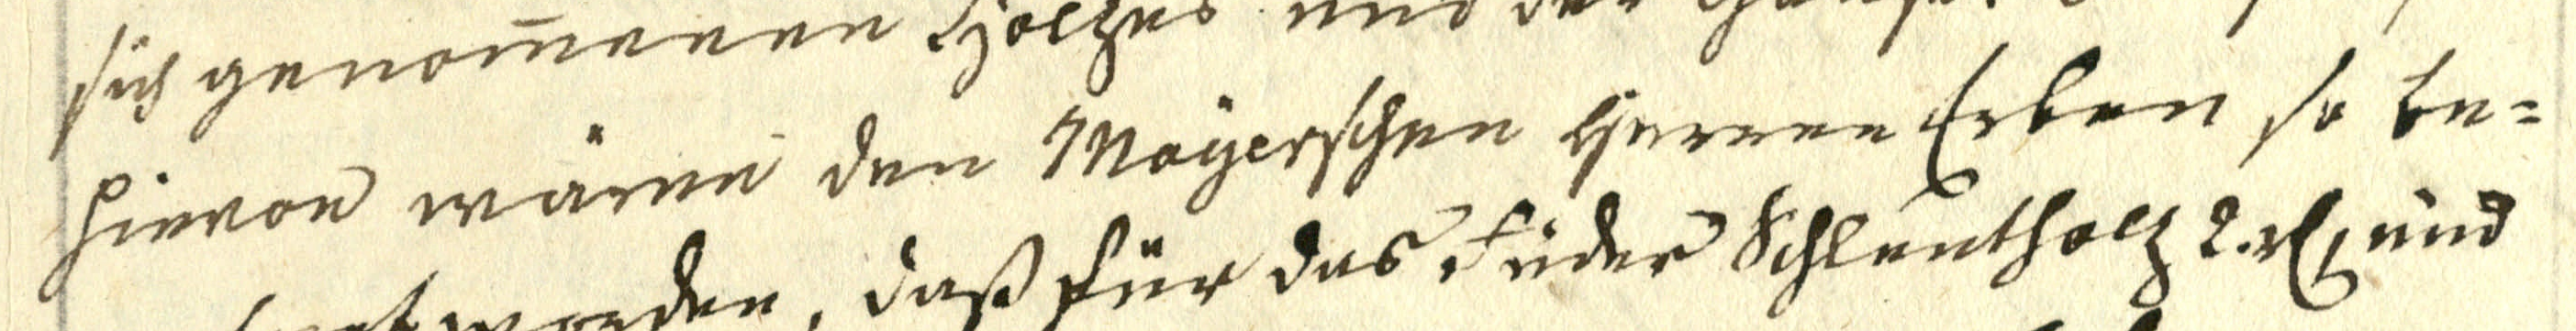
hievon wären den Maÿerschen Herren Erben so be¬
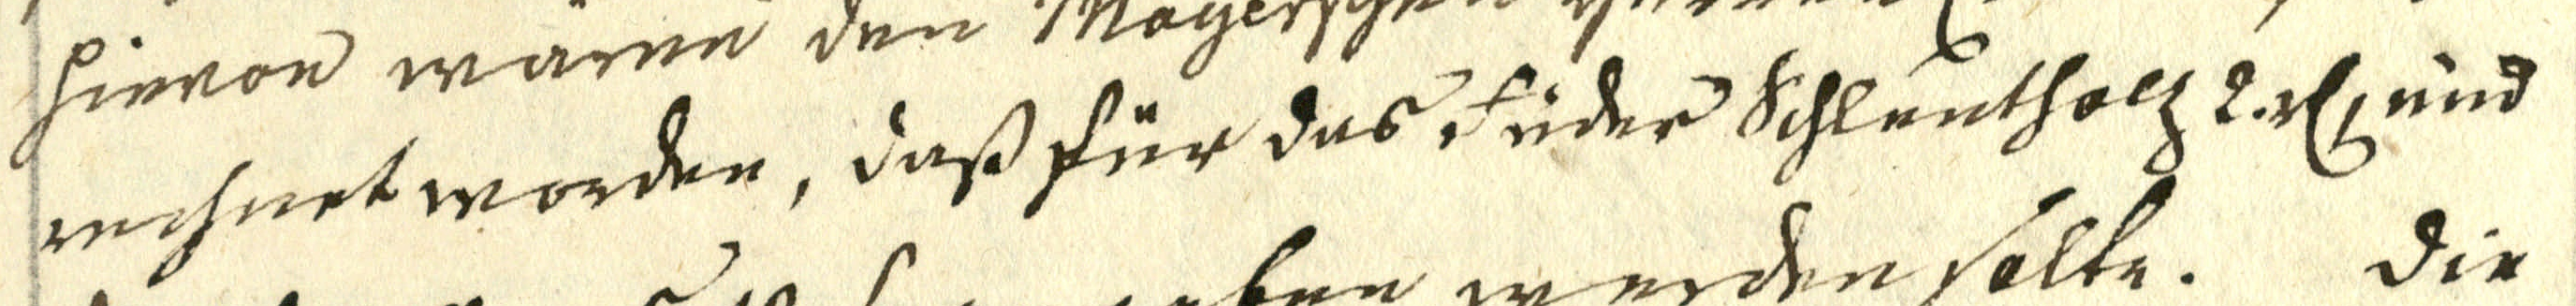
rechnet worden, daß für das Fuder Schlentholz 2 r, und
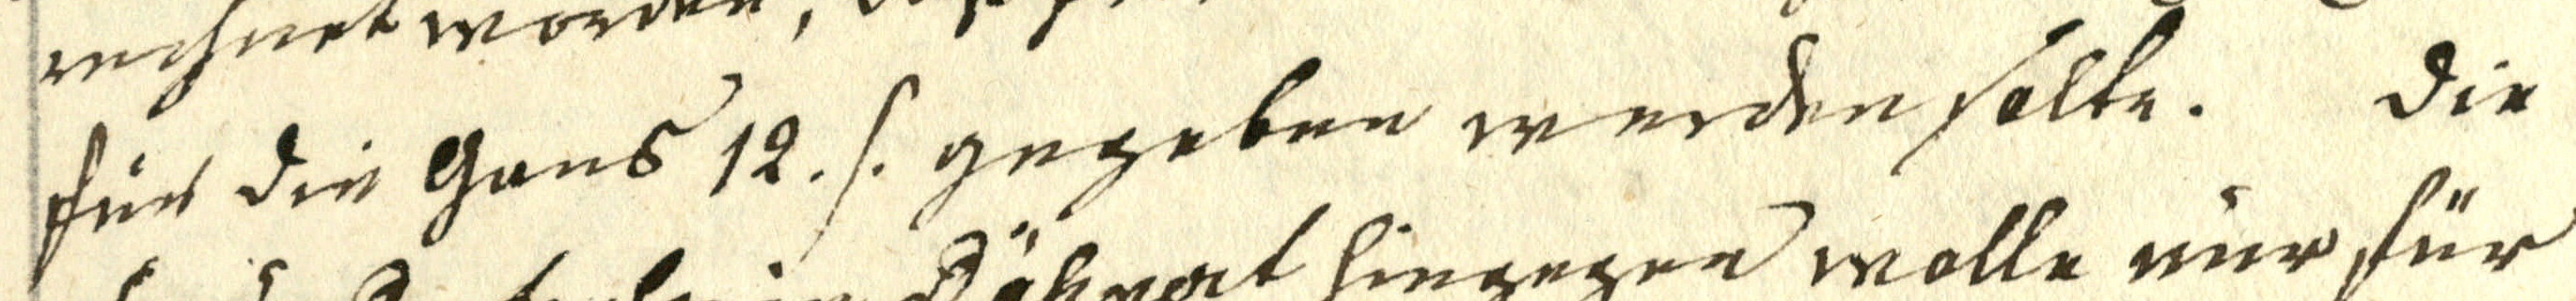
für die Gans 12. s. gegeben werden solte. Die
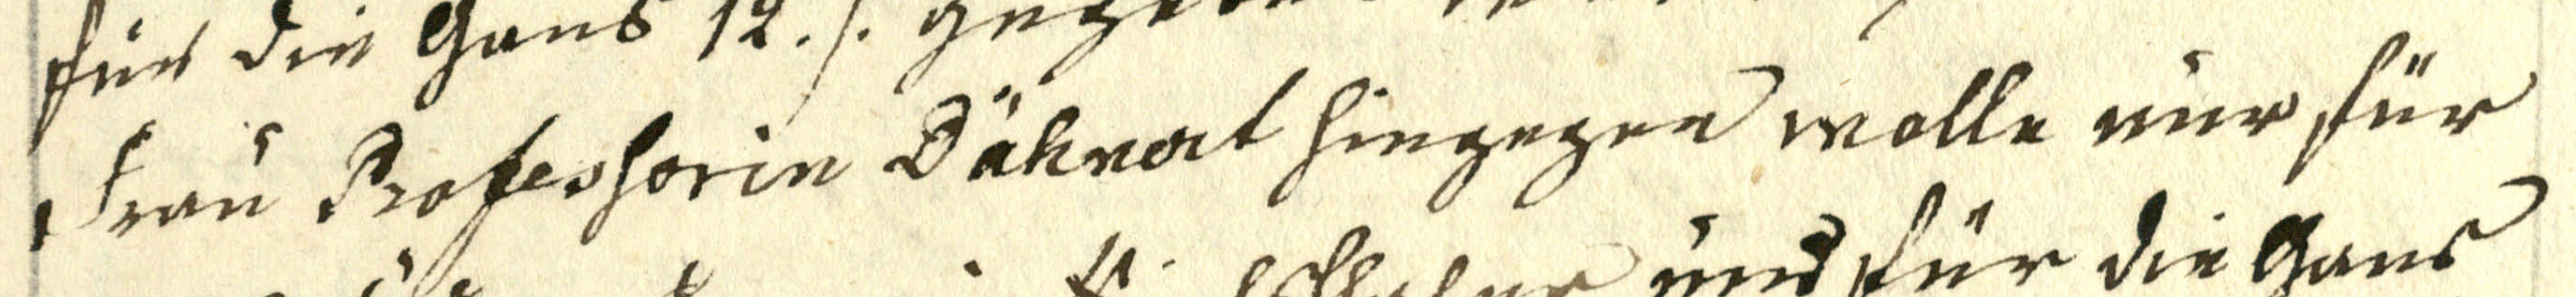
Frau Professorin Dähnert hingegen wolle nur für
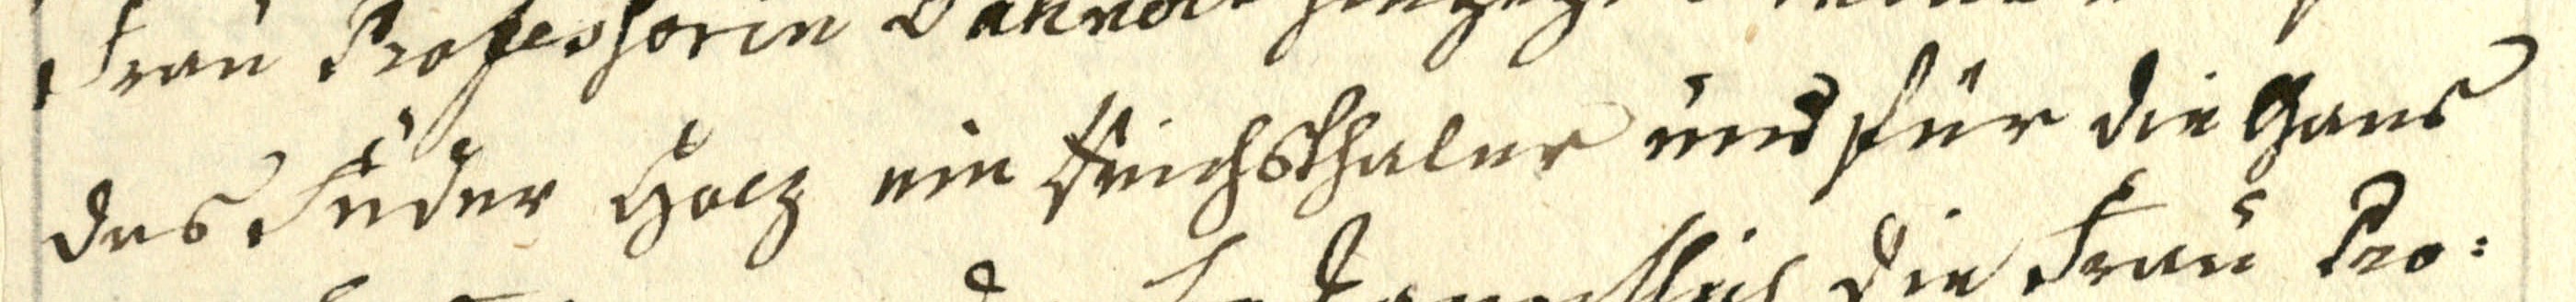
das Fuder Holz ein Reichsthaler und für die Gans
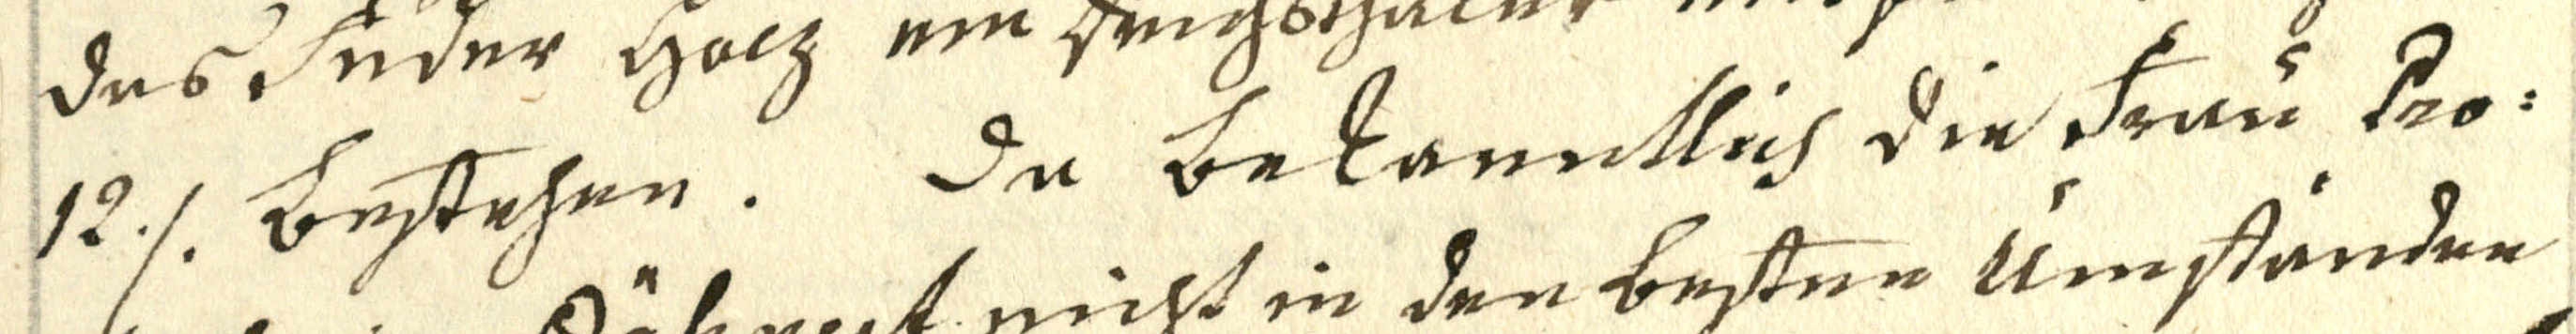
12 s. bestehen. Da bekanntlich die Frau Pro¬
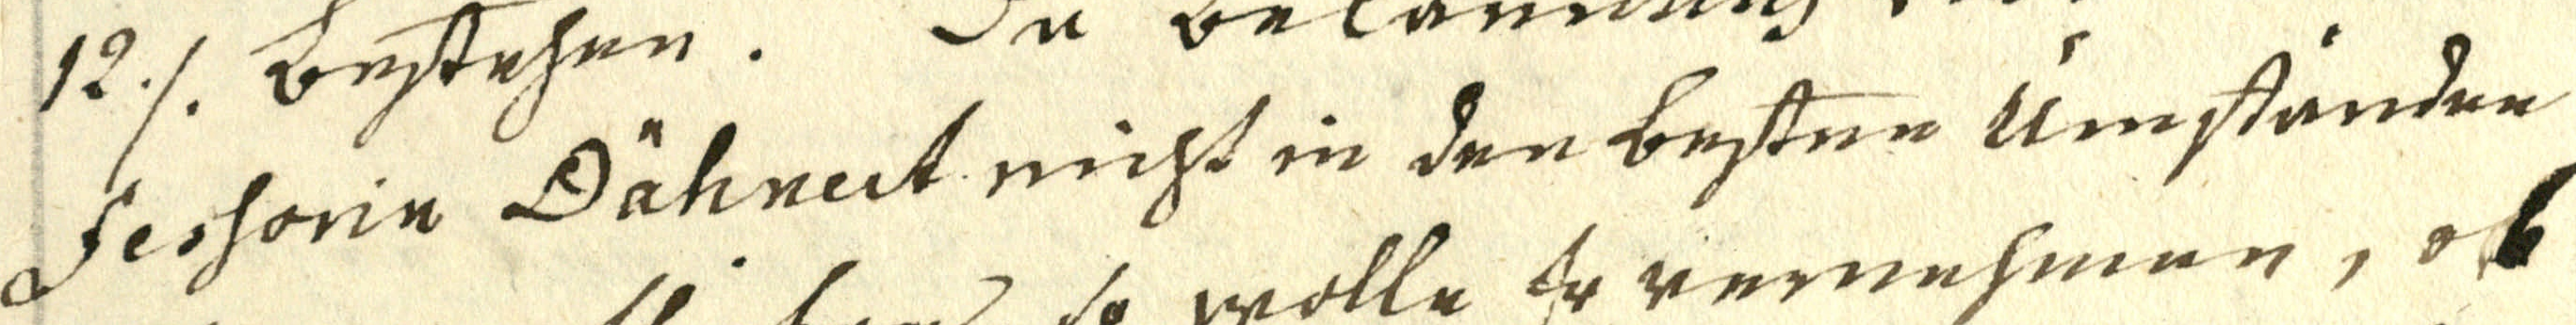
fessorin Dähnert nicht in den besten Umständen
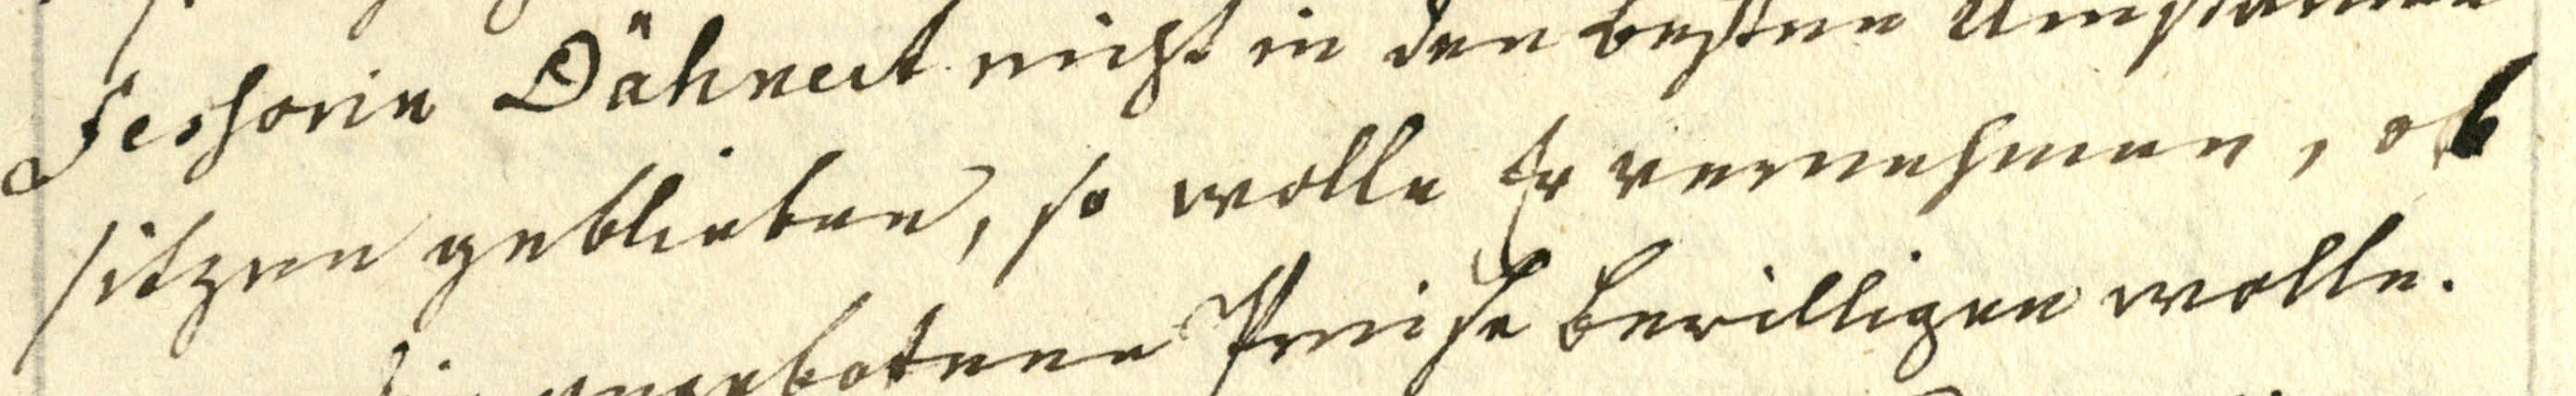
sitzen geblieben, so wolle Er vernehmen, ob
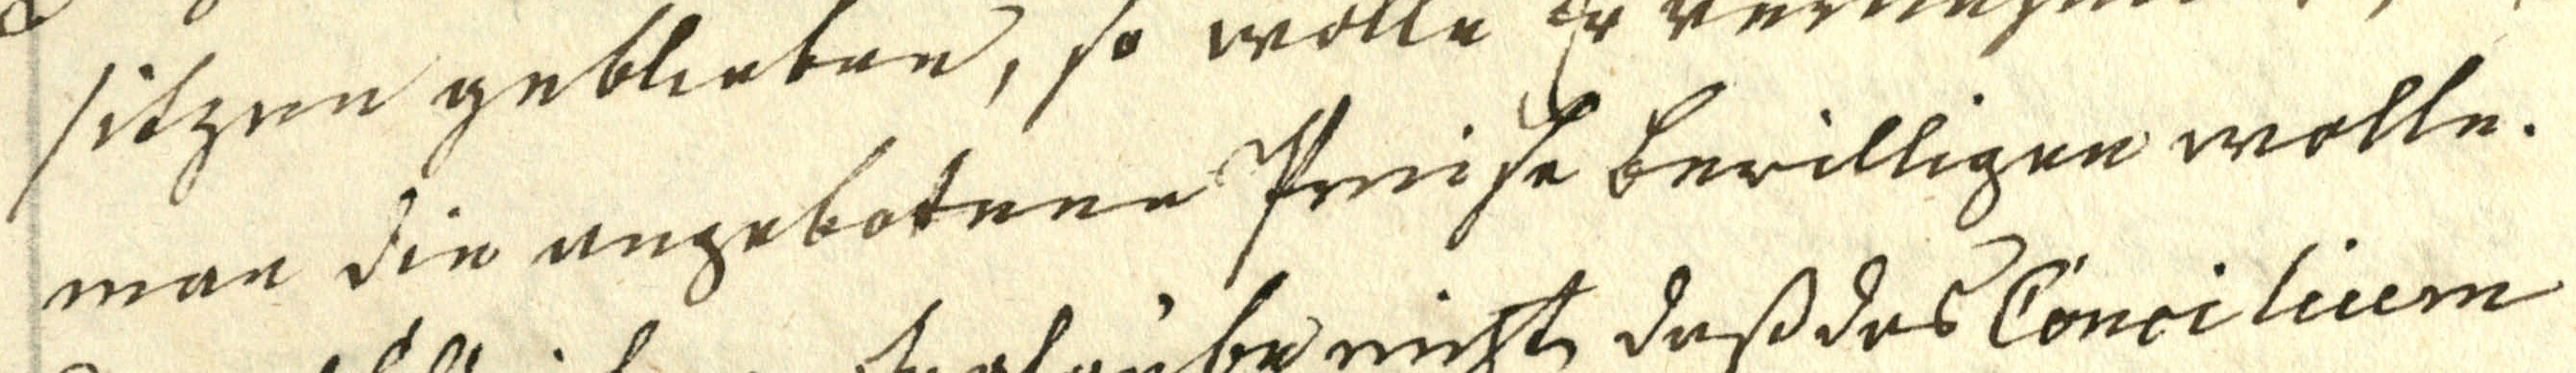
man die angebotene Preise bewilligen wolle.
